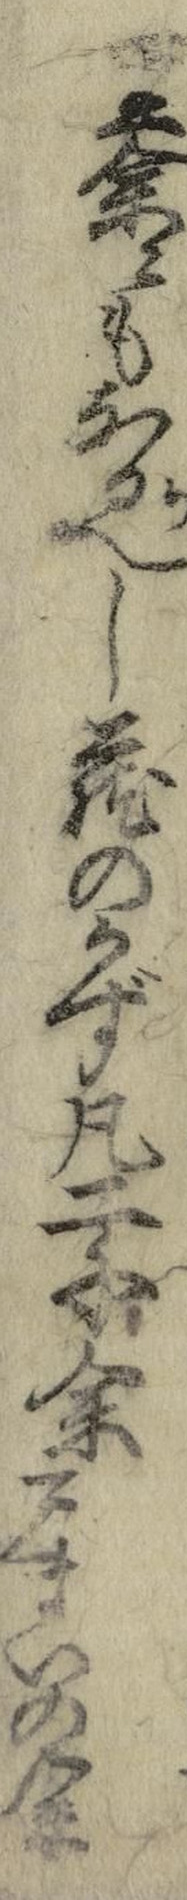余にもなるべし蔵のかず凡二千余戸まいの余
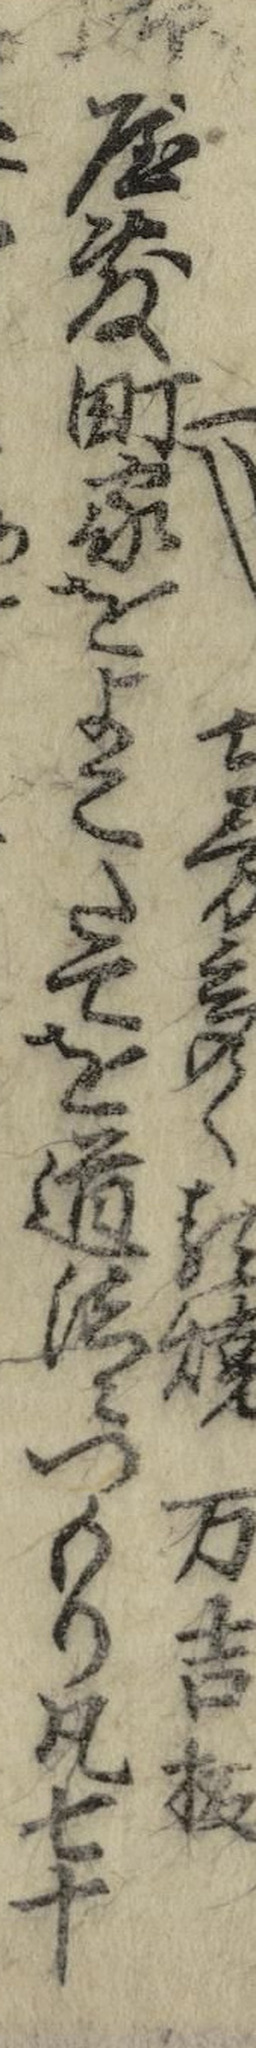屋敷町家をよこたてを道法につもり凡七十
